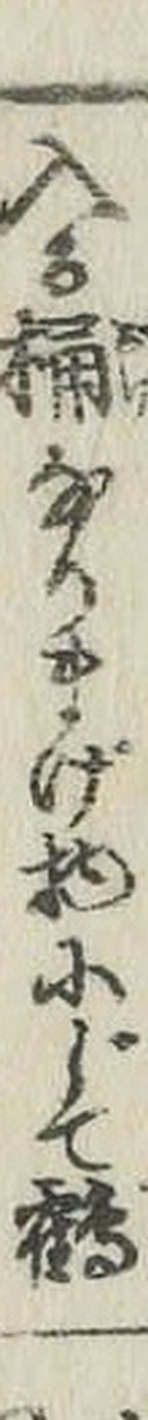入る桶なりまげ物にじて鶴
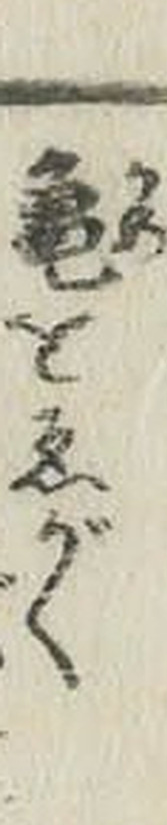亀をゑがく
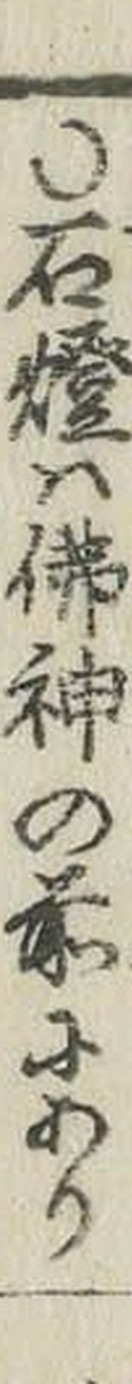○石灯は仏神の前にあり

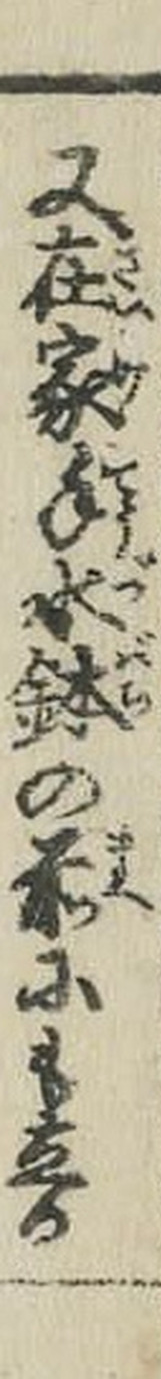又在家手水鉢の前にも立る
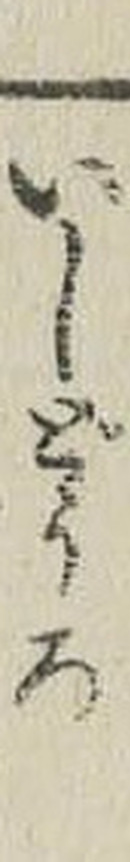いしどうろ
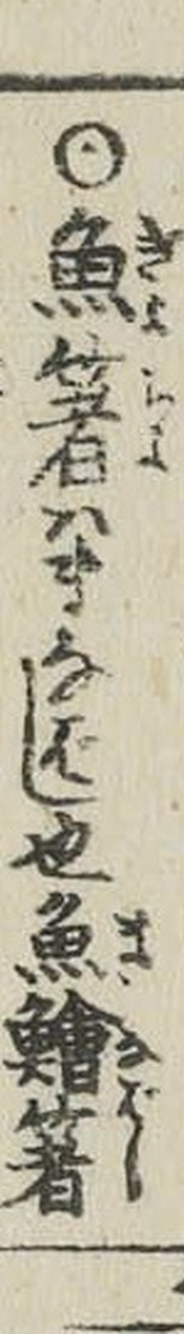○魚箸はまなばし也魚鱠箸
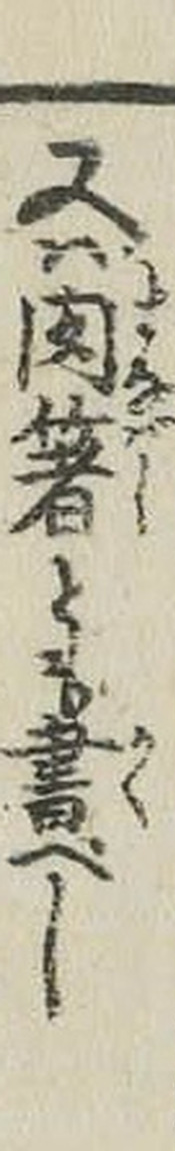又は肉箸とも書べし
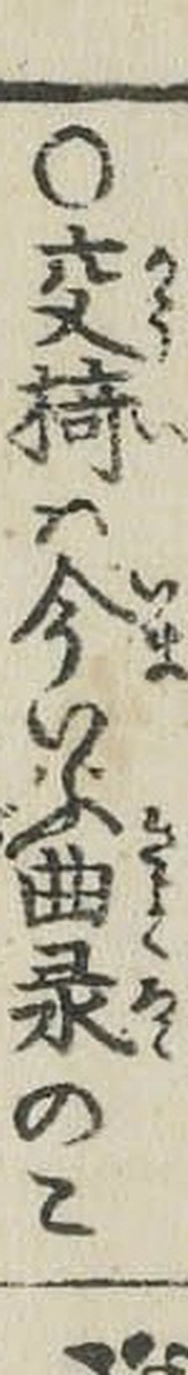○交椅は今いふ曲彔のこ
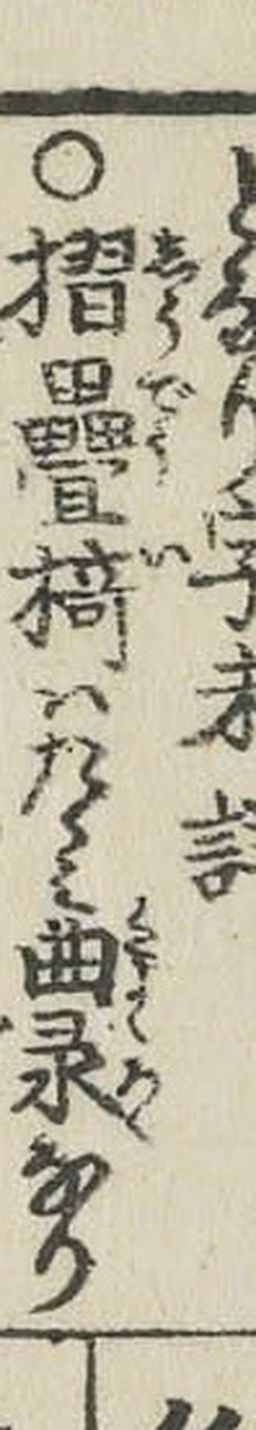○摺畳椅はたゝみ曲彔なり
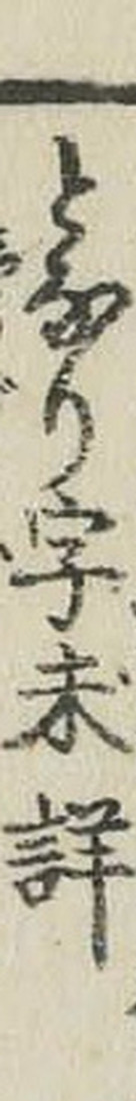となり字未詳
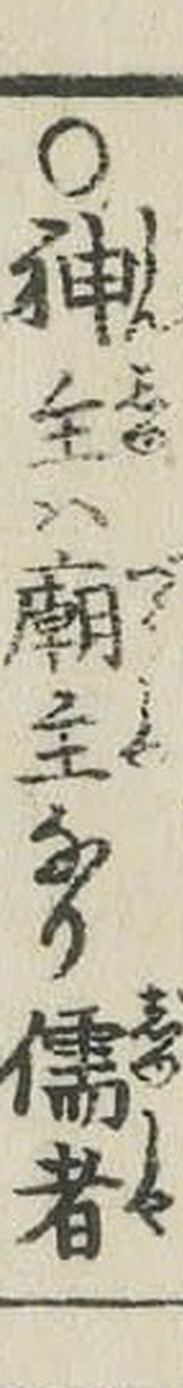○神主は廟主なり儒者
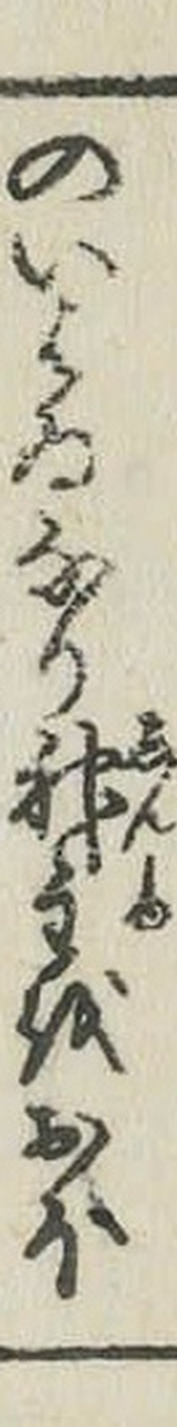のいはゐなり神主をおほ
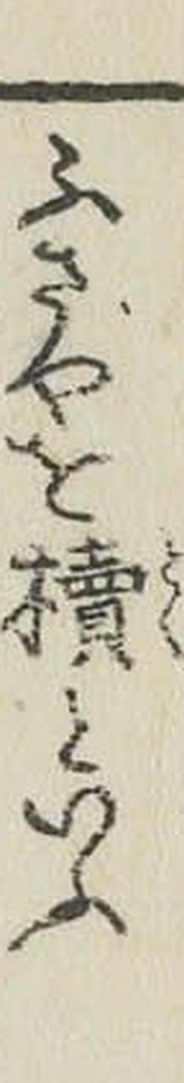ふさやを櫝といふ
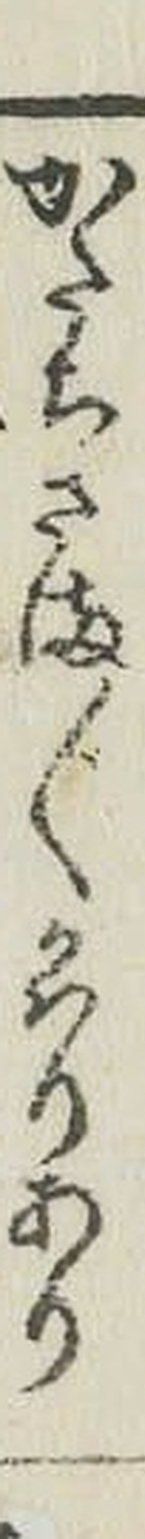かたちさま〴〵かはりあり
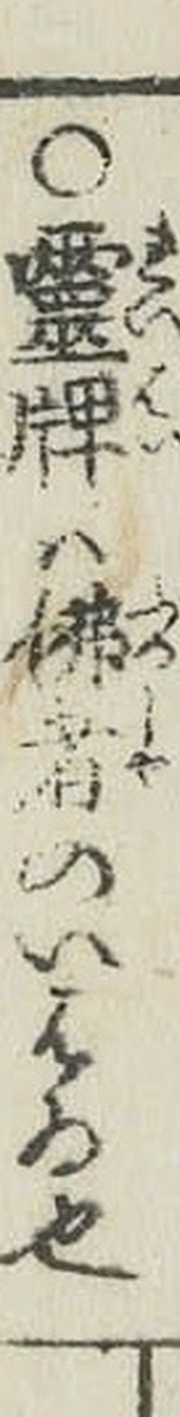○霊牌は仏者のいはゐ也
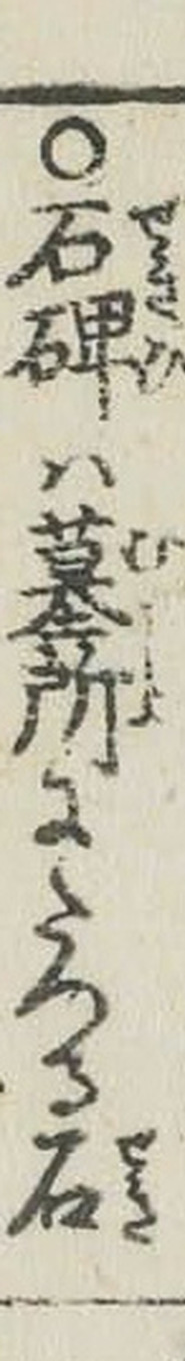○石碑は墓所にたつる石
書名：増補頭書訓蒙図彙大成 10巻 5:巻之9-11
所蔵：東京学芸大学教育コンテンツアーカイブ
